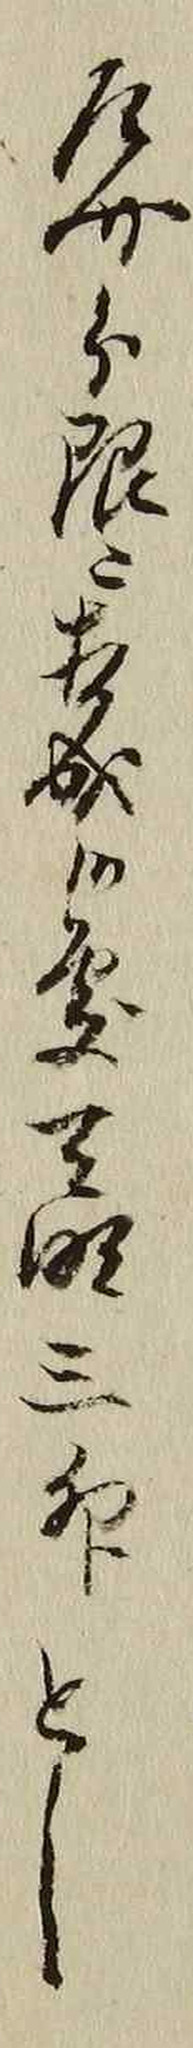左介分限ニ相成候処天明三卯とし
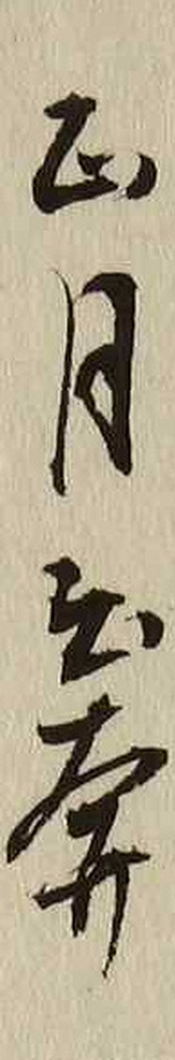正月出奔
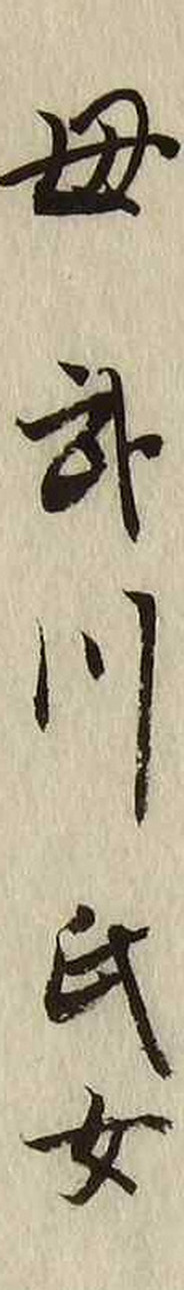母武川氏女
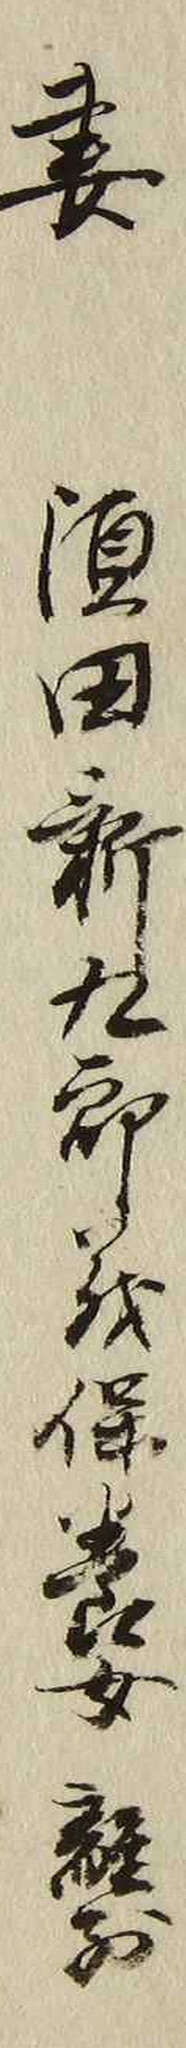妻須田新九郎義保養女離別
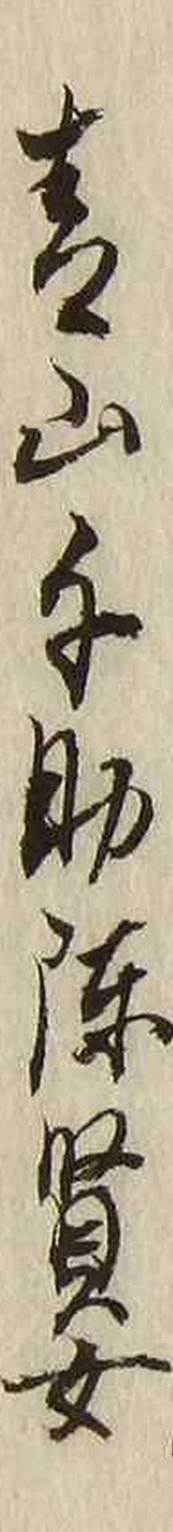青山千助陳賢女

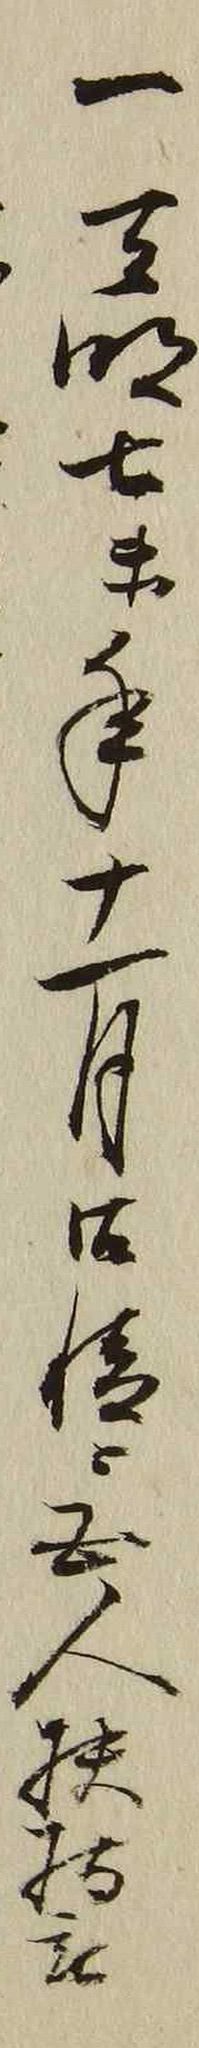一天明七未年十一月御情ニ五人扶持被
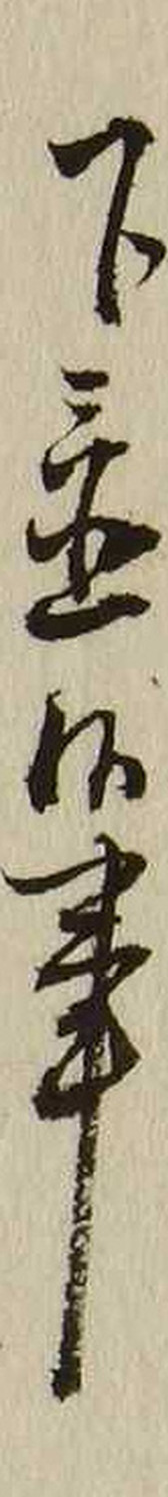下置候事
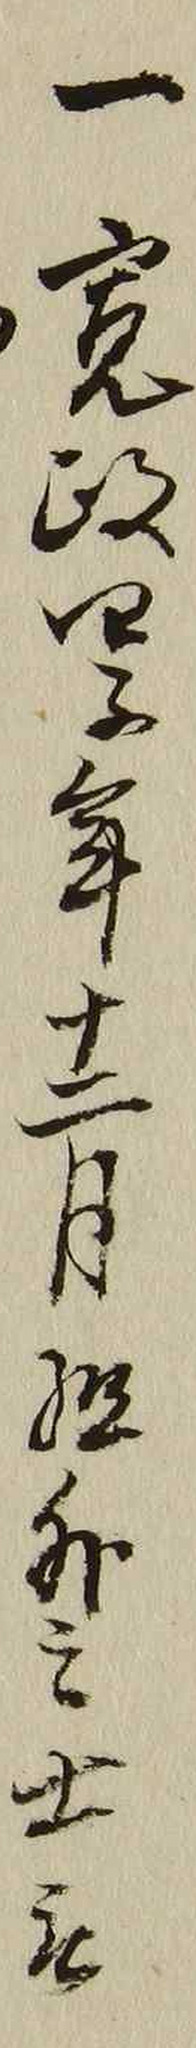一寛政四子年十二月組外之士被
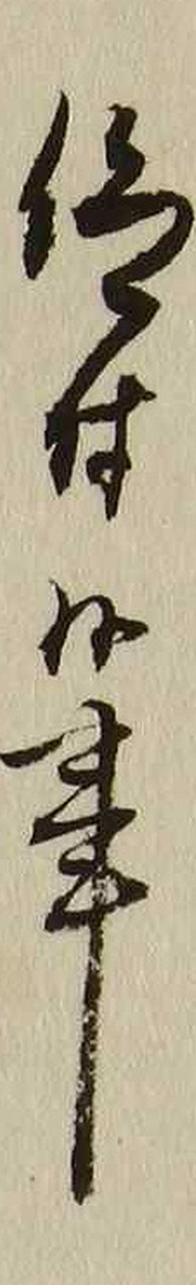仰付候事
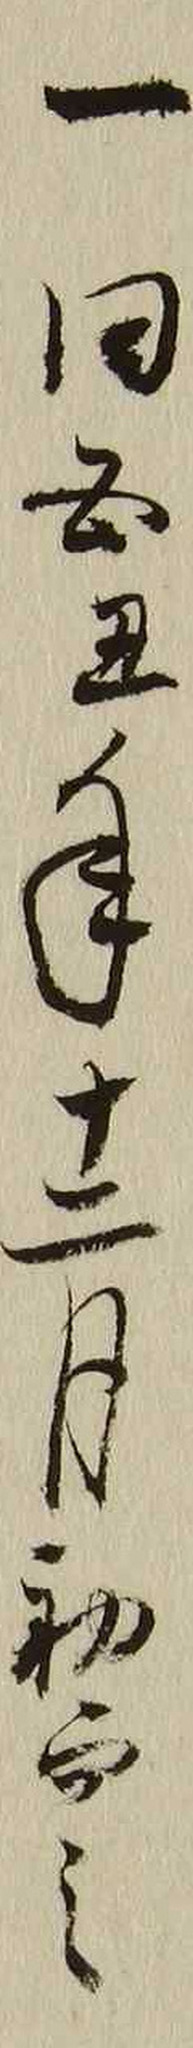一同五丑年十二月初而之
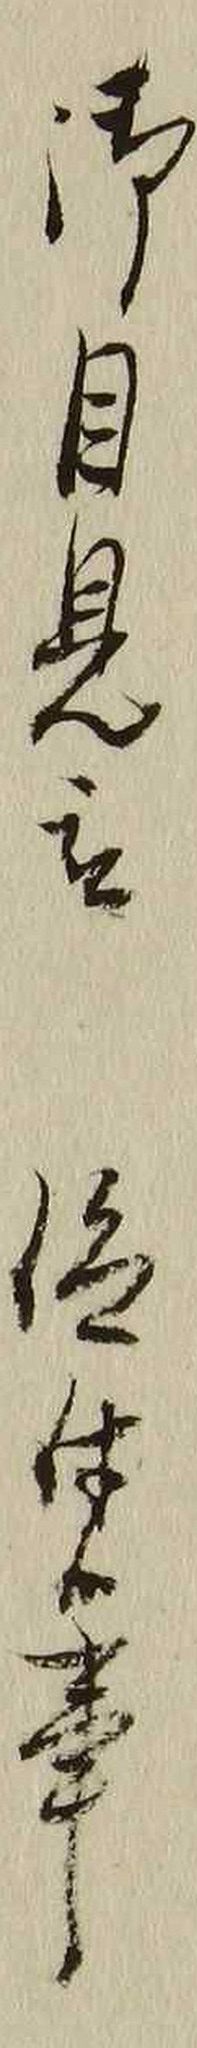御目見被仰付候事
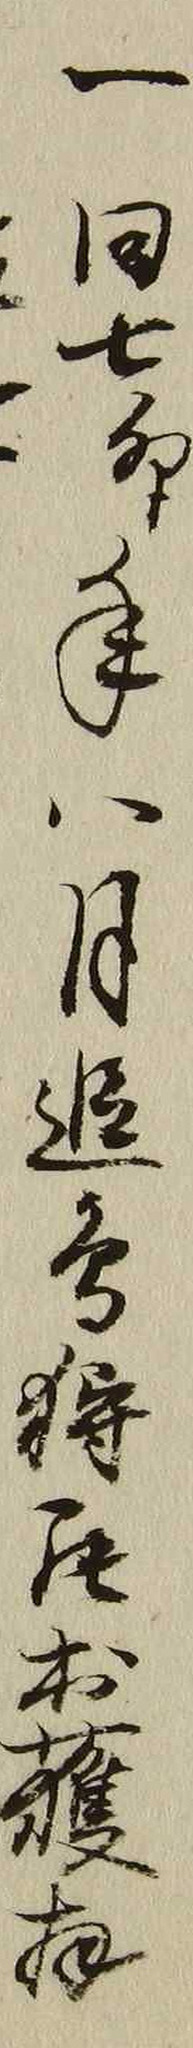一同七卯年八月追鳥狩罷出獲拝
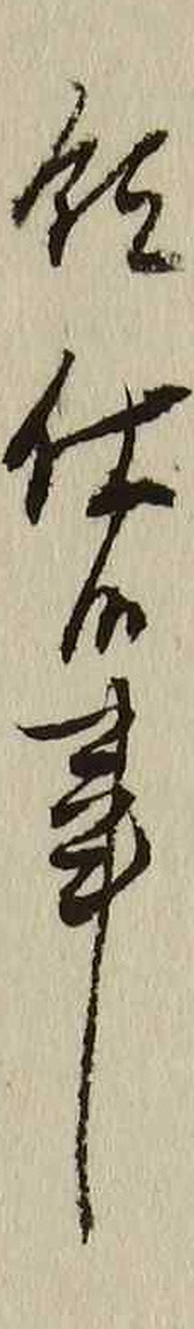領仕候事
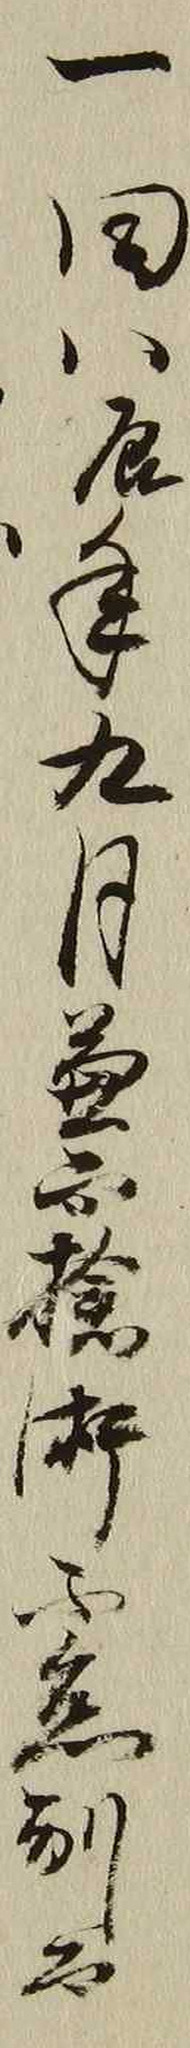一同八辰年九月兼而検術不怠別而
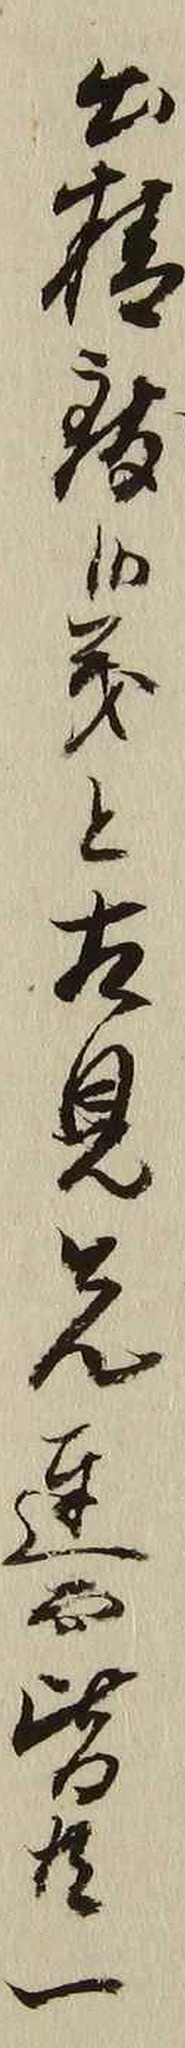出精致候義と相見先達而皆共一
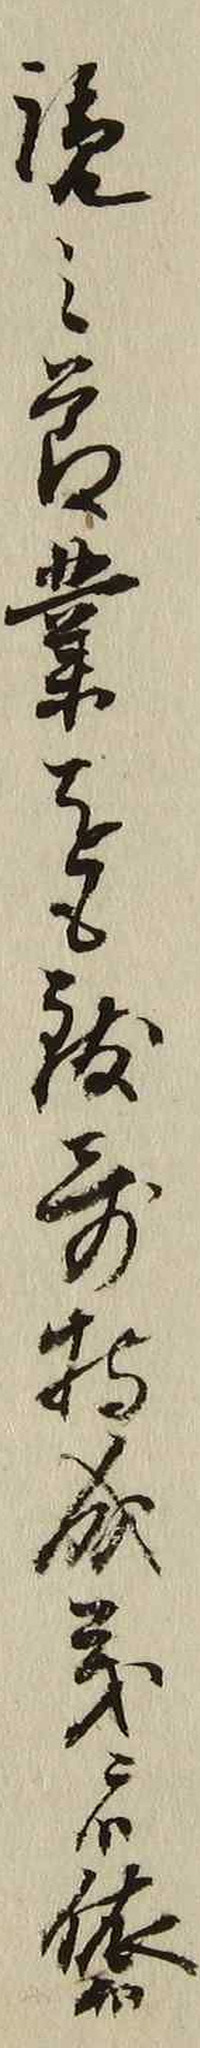覧之節業をも致奇特成義ニ候依而
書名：諸士系譜　巻之349　も之部5
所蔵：会津若松市立会津図書館
